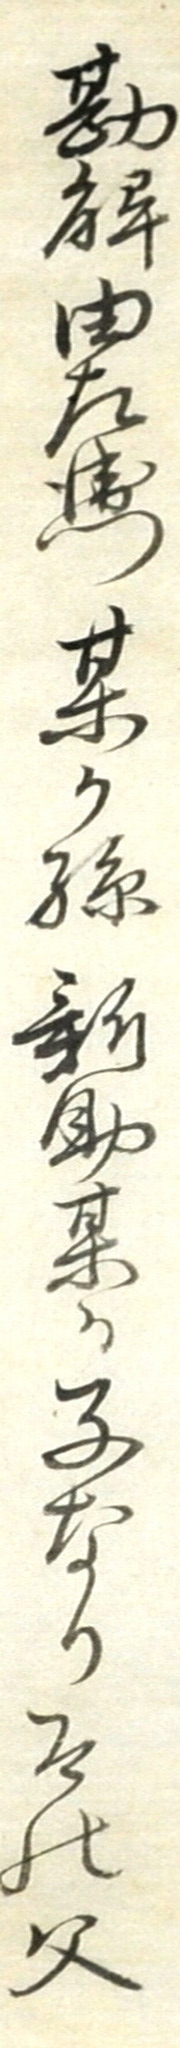勘解由左衛門某か孫新助某か子なりその父
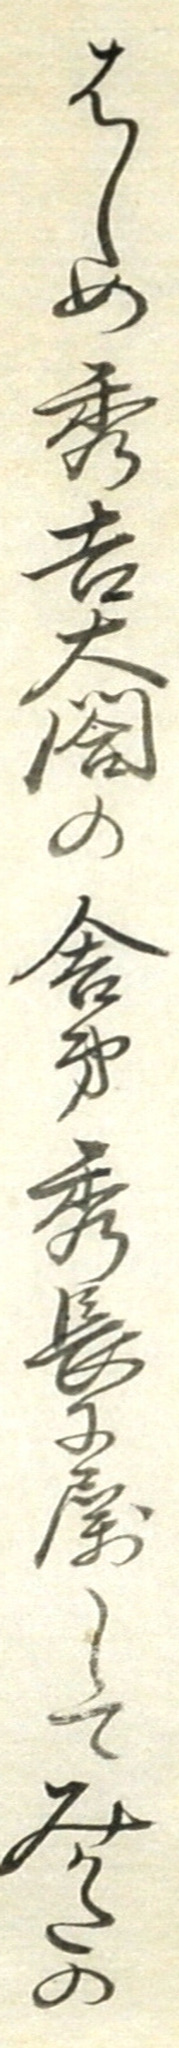はしめ秀吉太閤の舎弟秀長に属してみかたの
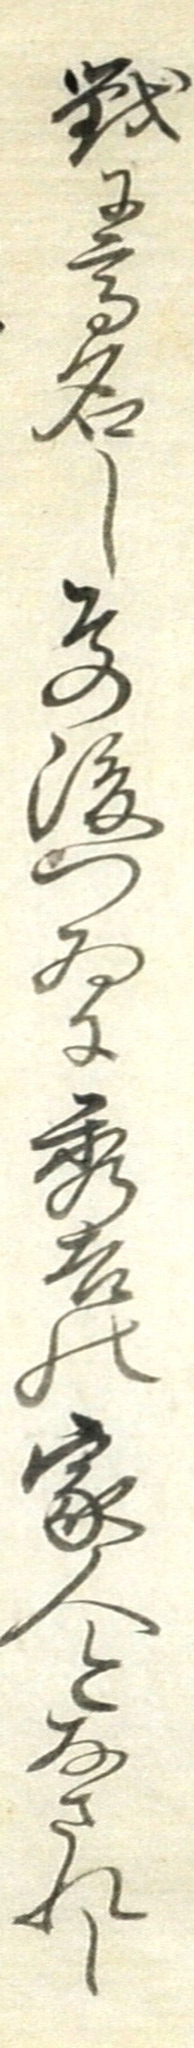戦に高名しその後つゐに秀吉の家人となされし
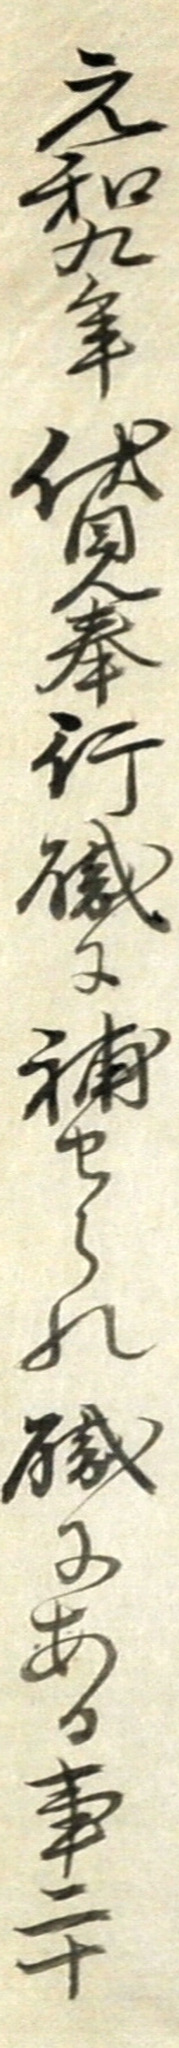元和九年伏見奉行職に補せられ職にある事二十
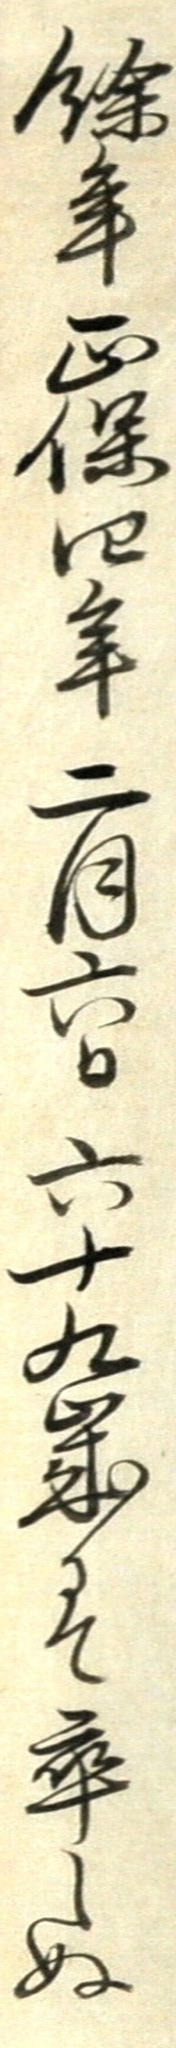余年正保四年二月六日六十九歳にて卒しぬ

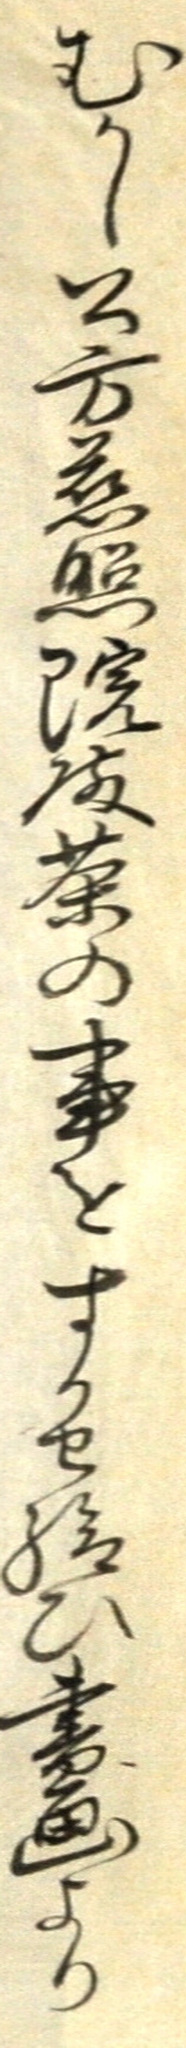むかし公方慈照院殿茶の事をすかせ給ひ書画より
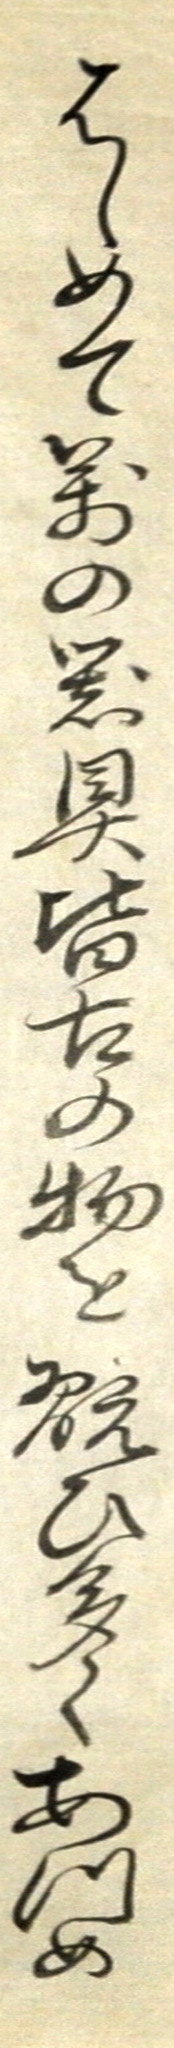はしめて万の器具皆古の物を翫ひ多くあつめ
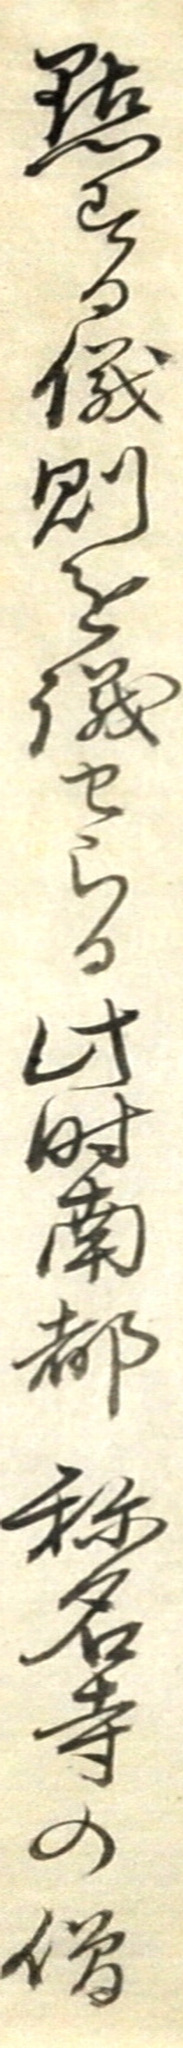点する儀則を議せらる此時南都称名寺の僧
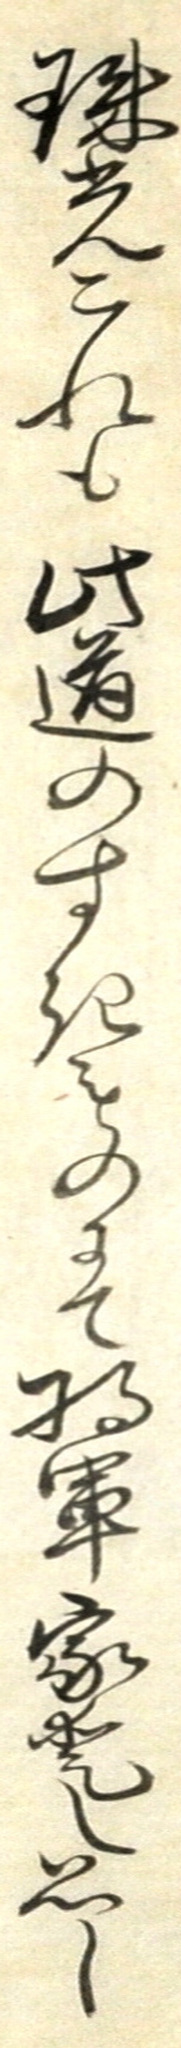珠光これも此道のすきものにて将軍家愛し思し
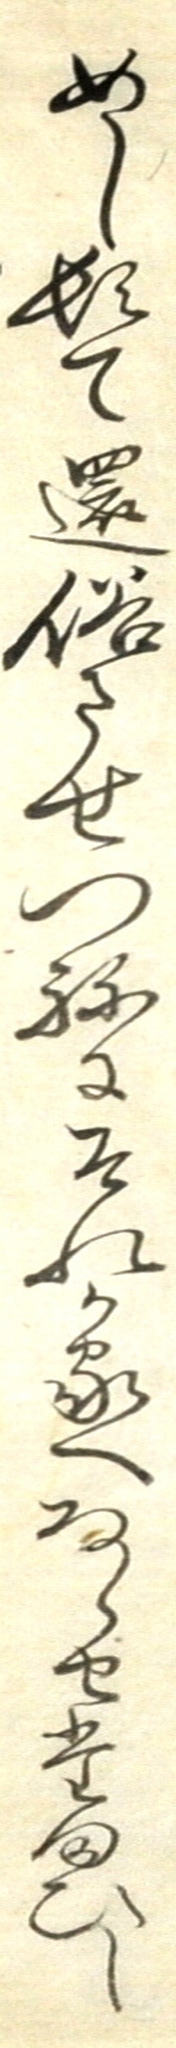めし頓て還俗させつねにそれか家へならせたまひし
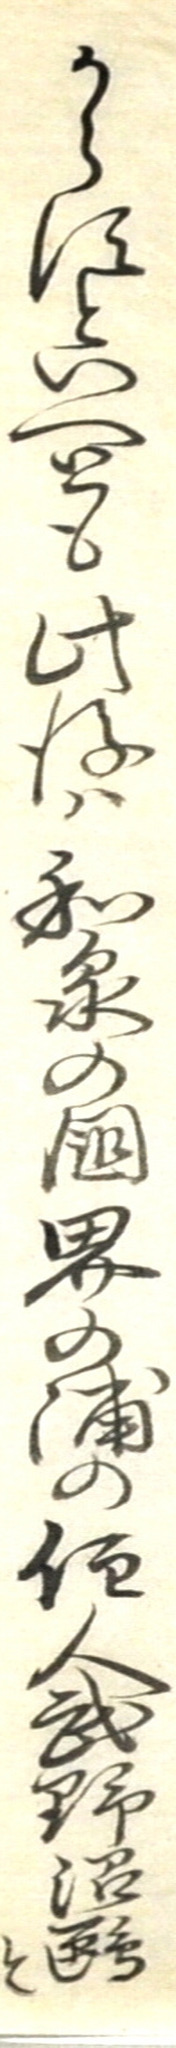からすといへとも此後は和泉の国界の浦の住人武野紹鷗と
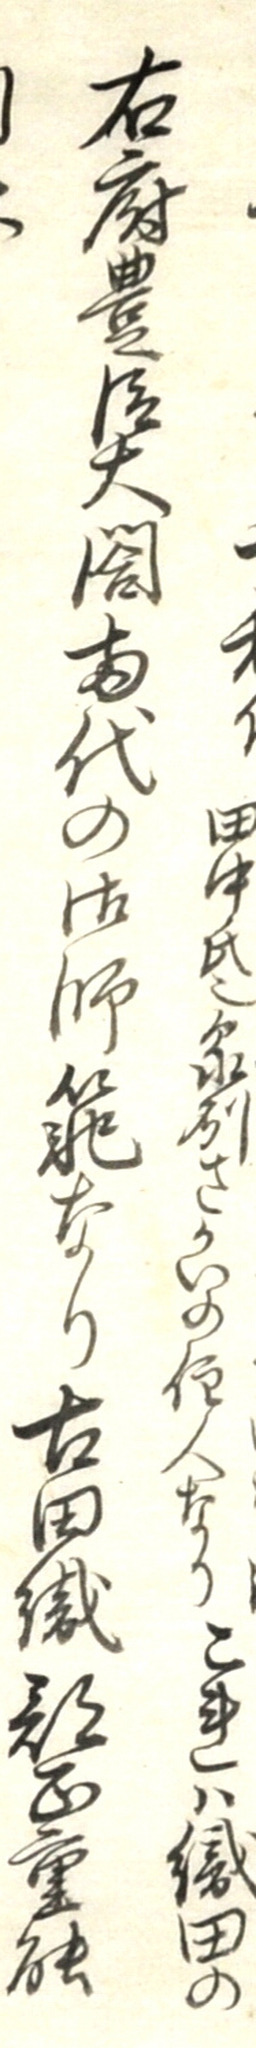右府豊臣太閤当代の御師範なり古田織部正重能
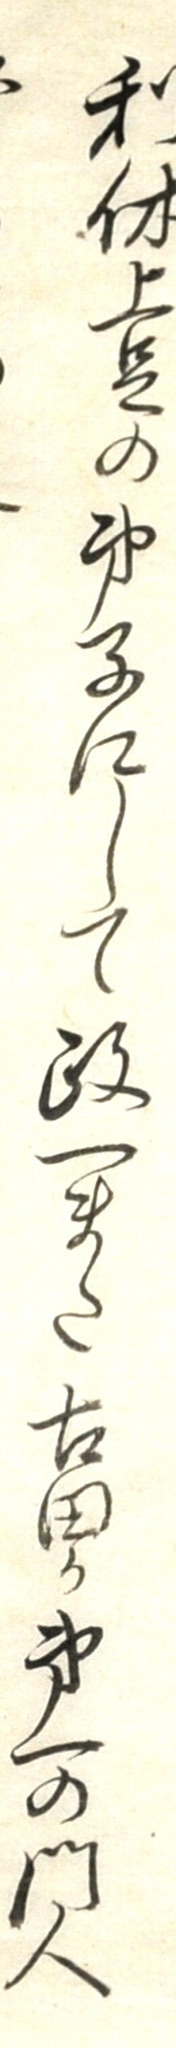利休上足の弟子にして政一また古田か第一の門人
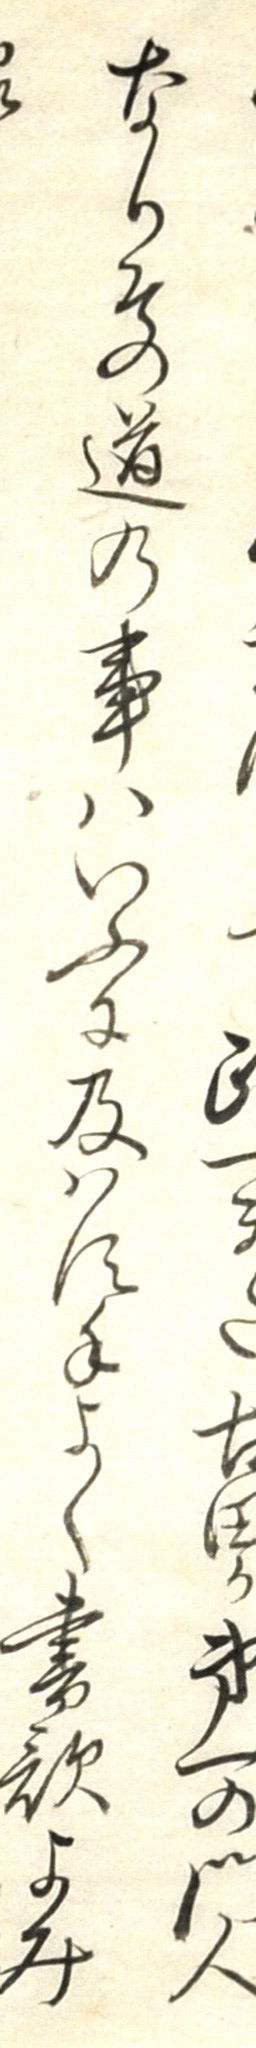なりその道の事はいふに及はす手よく書歌よみ
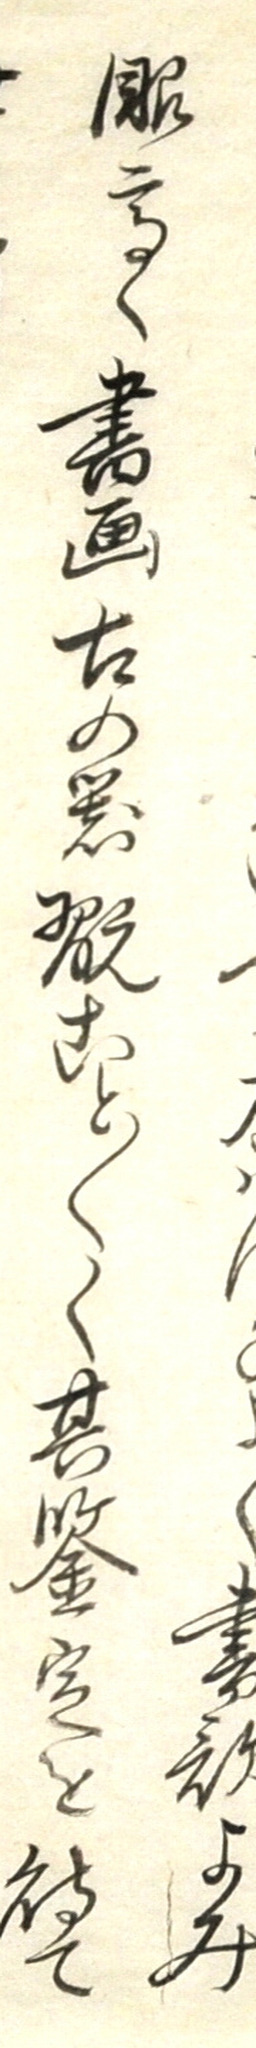眼高く書画古の器翫こと〳〵く其鑑定を待て
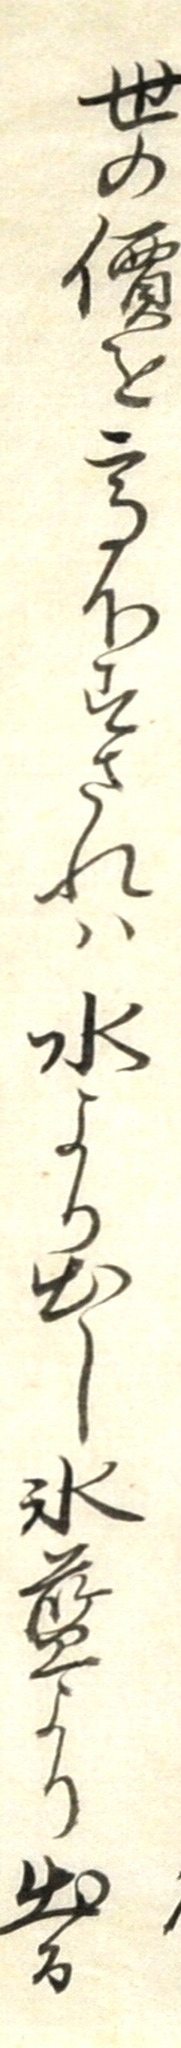世の価を高下すされは水より出し氷藍より出る
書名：藩翰譜（六）
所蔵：伊那市立高遠町図書館・合同会社AMANE
